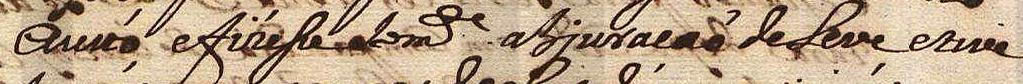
Autto, e fizesse somte abjuraçaõ de Leve, e tive
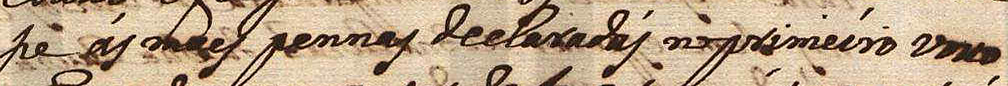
sse as mais pennas declaradas no primeiro votto
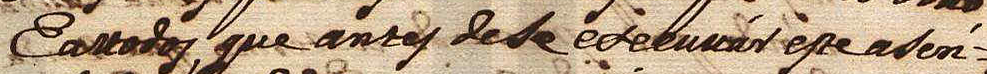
E a ttodos, que antes de se executar este asen
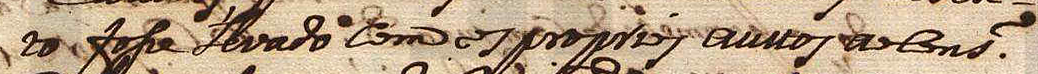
to fosse Levado com os proprios auttos ao Cons.o
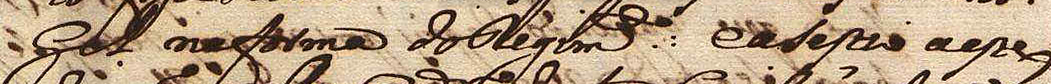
Gal na forma do Regim.to: e asestio a este
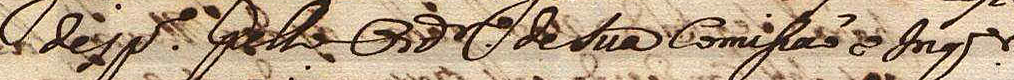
desp.o pello Ord.o de Sua Comissaõ o Inq.or
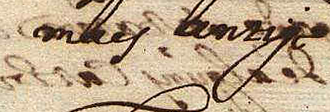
mais antigo
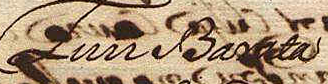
Luiz Barata
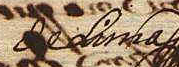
de Lima
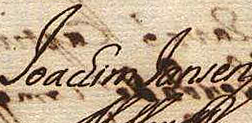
Ioachim Iansen
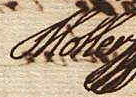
Moller
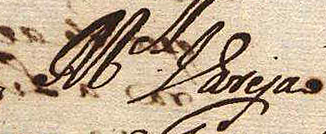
M.el Varejaõ
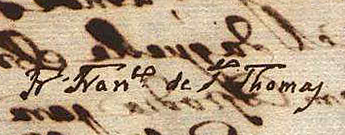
Fr Franco de Sto Thomas
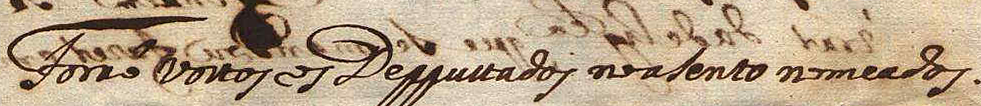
Foraõ vottos os Depputtados no asento nomeados.
